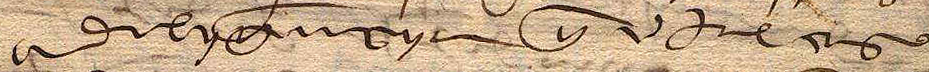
a dilygencya q̄ ē tal caso
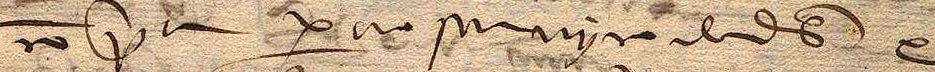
c̄op̄a ꝑa o seruyço de ds̄ e
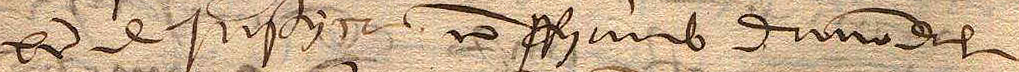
bē de Justyça c̄offyando da ūodade
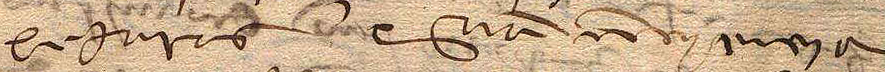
letaras e saā c̄ocyençya
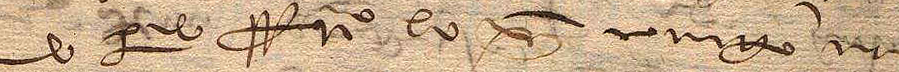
do Ldo ffrco lop̄z conigo na
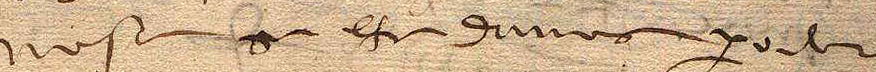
nosa se lhe damos ꝑoder
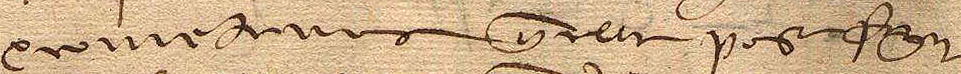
e cometemos q̄ elle posa fazer
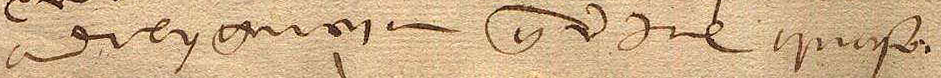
a dilygençya q̄ ē tal quaso
